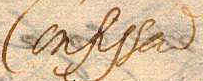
Confissaõ
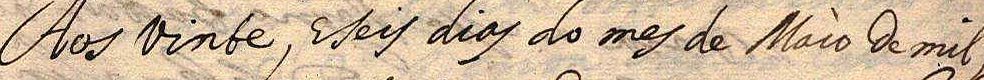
Aos vinte, E seis dias do mes de Maio de mil
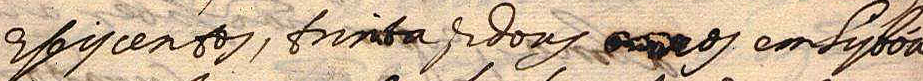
E seiscentos, trinta, E dous a_nos em Lisbóa
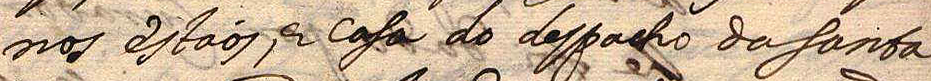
nos estaós, E casa do despacho da Santa
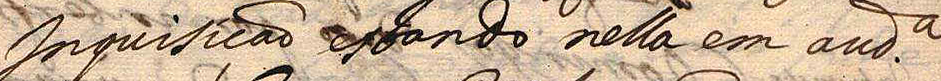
Jnquisição estando nella em aud.a
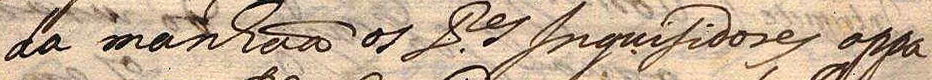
da manhāa os s.res Jnquisidores appa
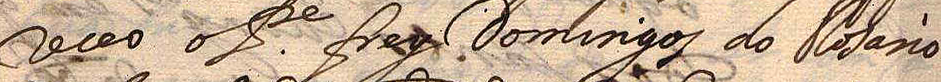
receo o P.e frey Domingos do Rosario
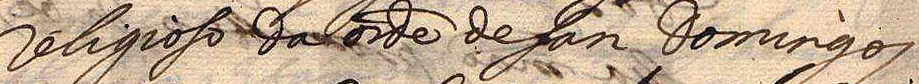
religioso da ōrde de San Domingos
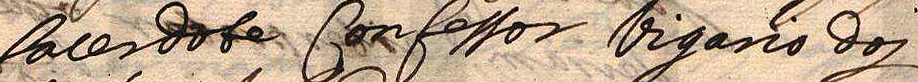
Sacerdote Confessor Vigario dos
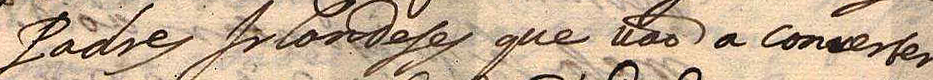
Padres Jrlandeses que uão a converter
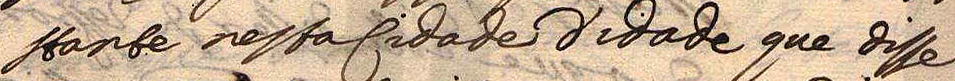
stante nesta Cidade d’idade que disse
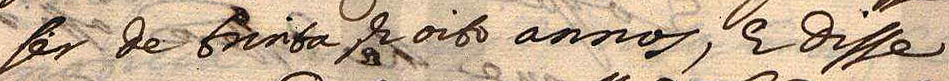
ser de trinta, E oito annos, E disse
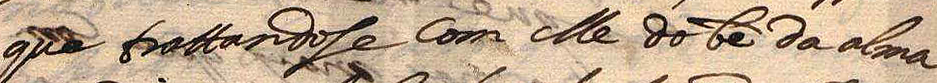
que trattandose com elle do b̄e da alma
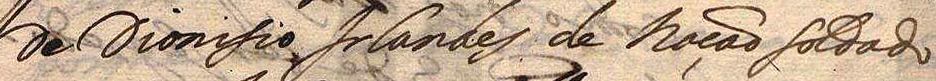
de Dionisio Jrlandes de Nação soldado
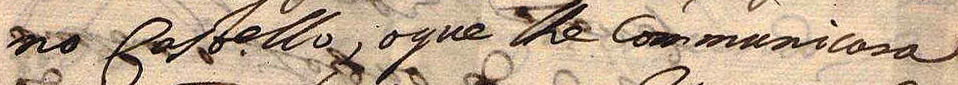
no Castello, o que lhe communicara
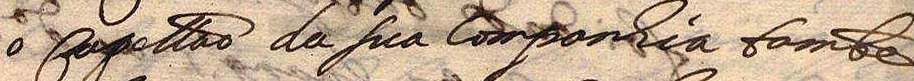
o Capellão da sua companhia tamb̄e
